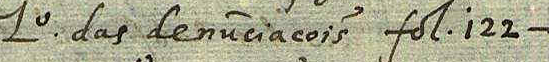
Lo. das denūciaçois̄ fol. 122 –
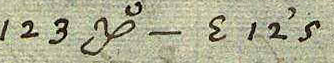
123 ꝟo — E 125
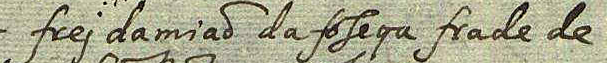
frej damião da fōseqa frade de
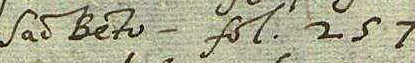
Saõ Bēto – fol. 257
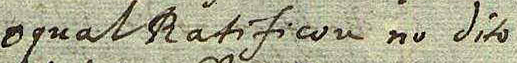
o qual Ratificou no dito
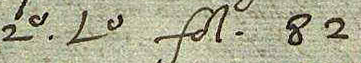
2o. Lo. fol. 82
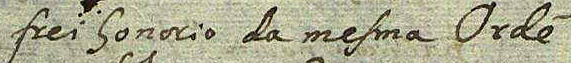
frei honorio da mesma Ordē
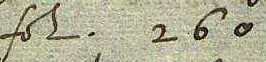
fol. 260
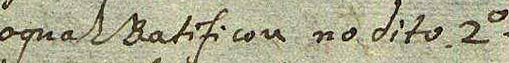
o qual Ratificou no dito .2o.
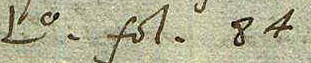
Lo. fol. 84
